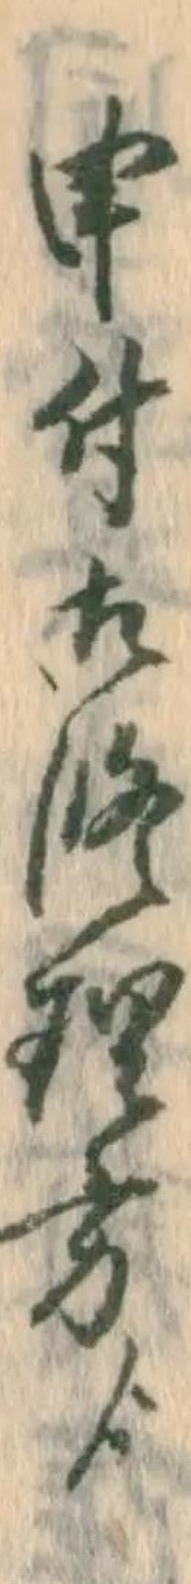申付御修理方ゟ
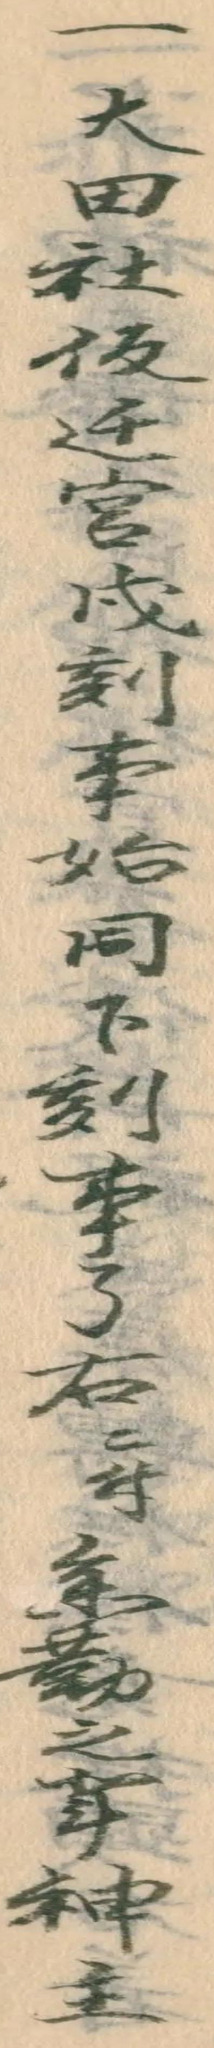一大田社仮迁宮戌刻本始同下刻本了右ニ付参勤之輩神主
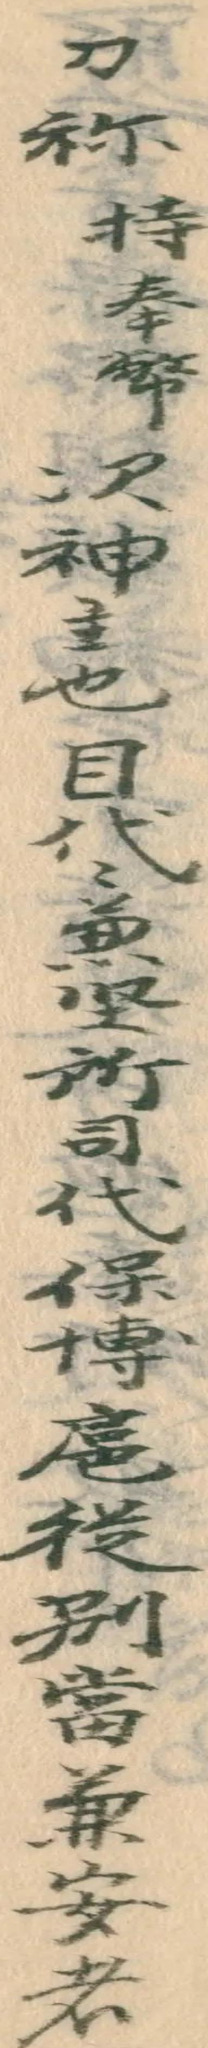刀祢持奉幣次神主也目代々兼堅所司代保博扈従別当兼安者
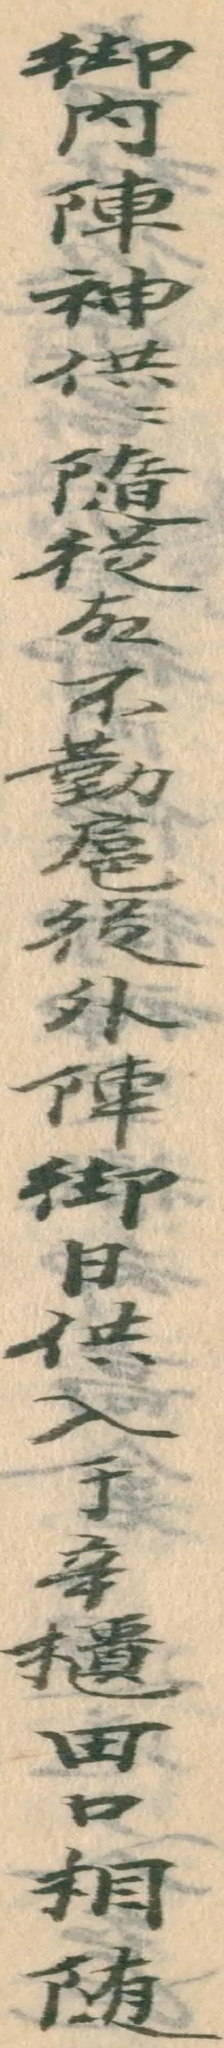御内陣神供ニ随従故不勤扈従外陣御日供入于辛櫃田口相随

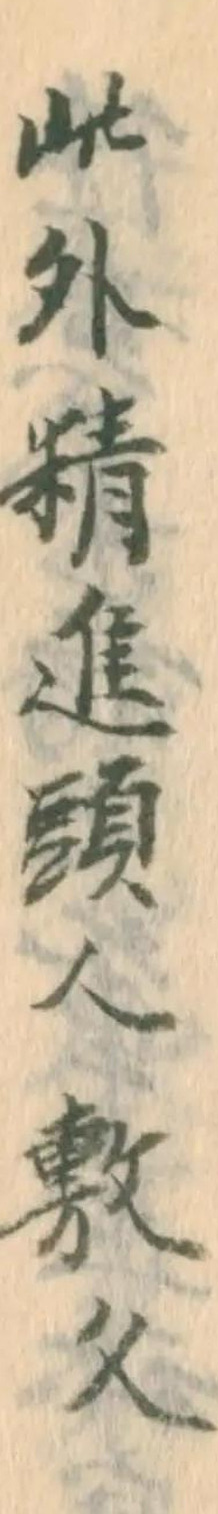此外精進頭人敷久
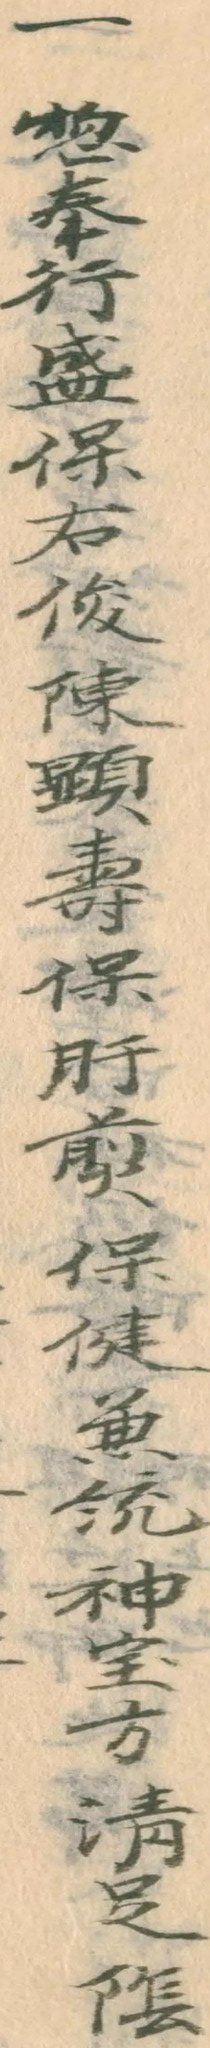一惣奉行盛保右俊陳顕寿保肝煎保健兼統神宝方清足陰
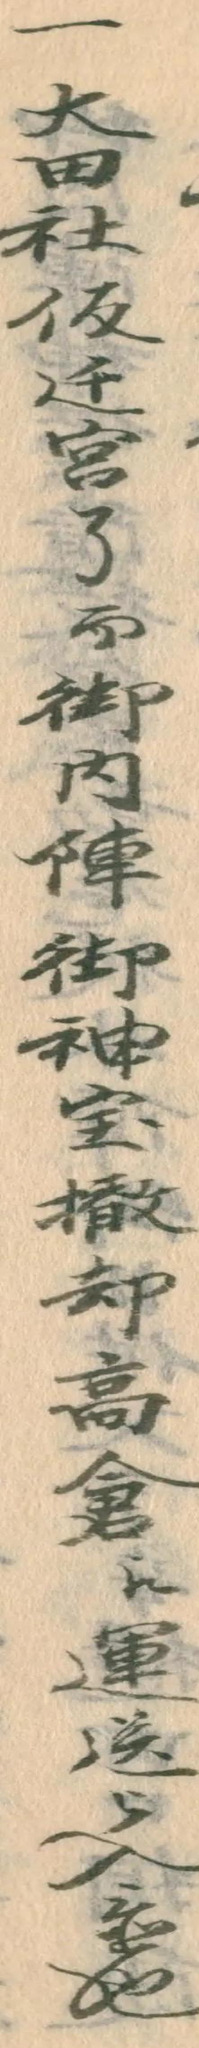一大田社仮迁宮了而御内陣御神宝撤却高倉江運送被入置也
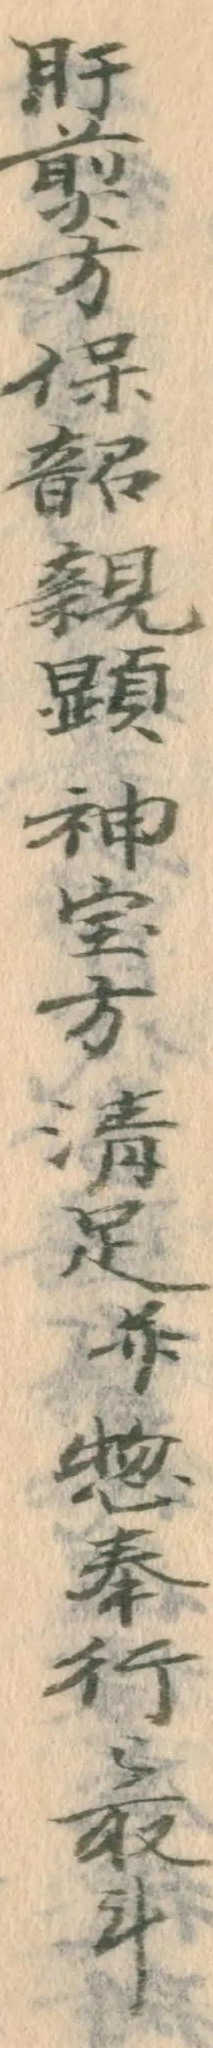肝煎方保韶親顕神宝方清足并惣奉行被取計
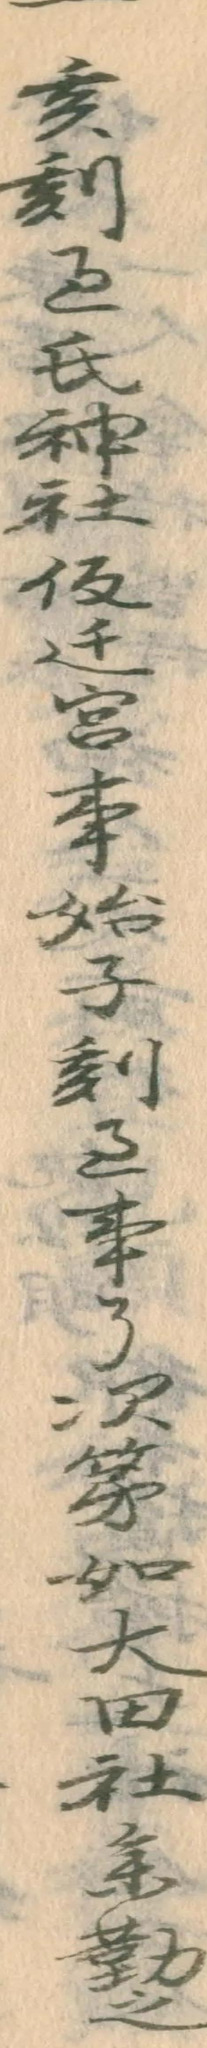一亥刻過氏神社仮迁宮本始子刻過事了次第如大田社参勤之
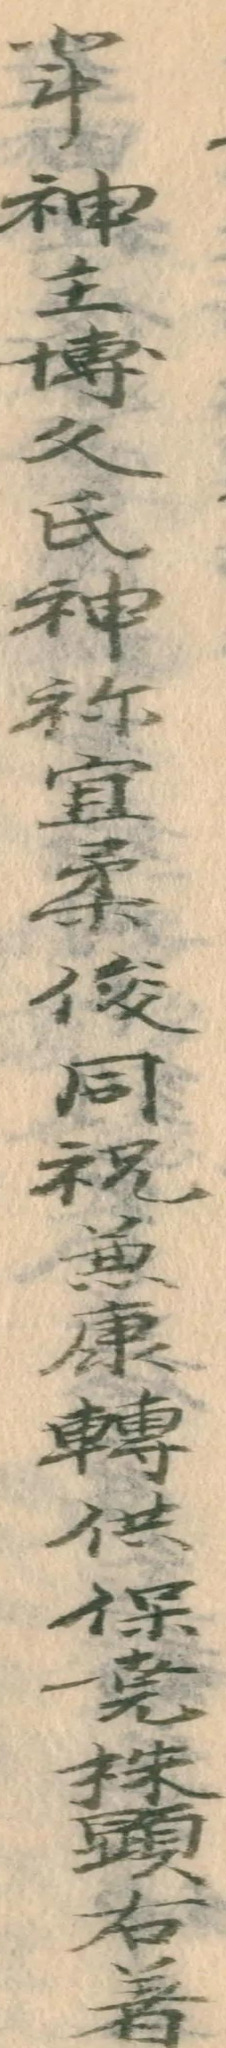輩神主博久氏神祢宜柔俊同祝兼康転供保尭株顕右着
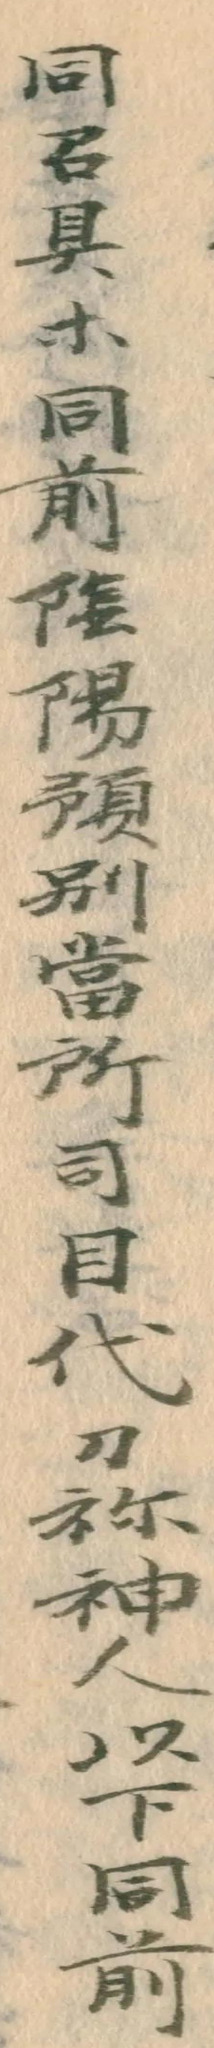同召具等同前陰陽預別当所司目代刀祢神人以下同前
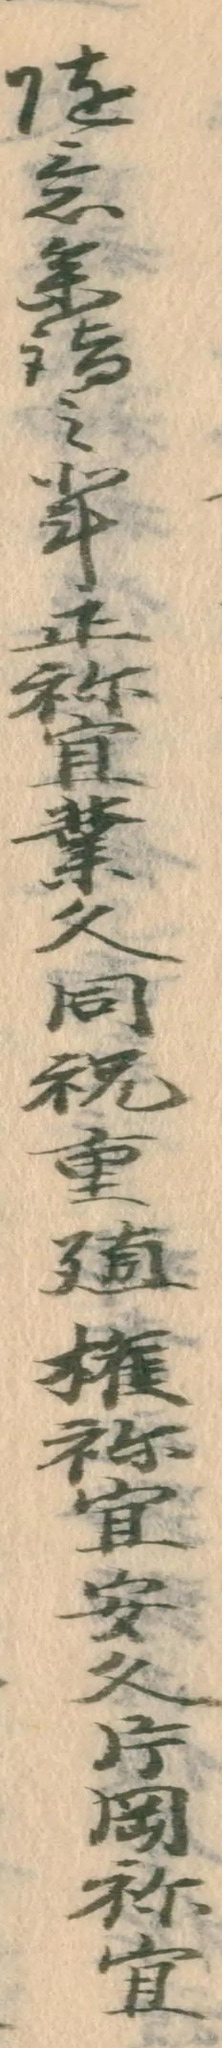一随意参詣之輩正祢宜業久同祝重殖権祢宜安久片岡祢宜
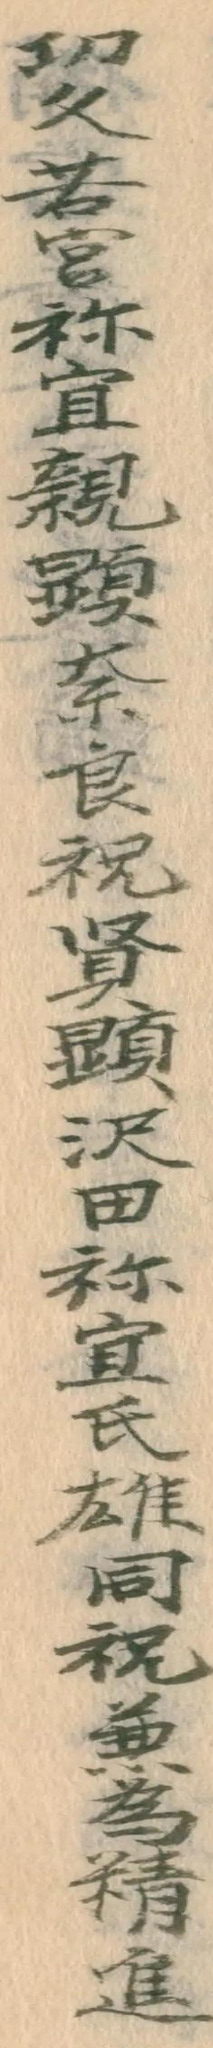功久若宮祢宜親顕奈良祝賢顕沢田祢宜氏雄同祝兼為精進
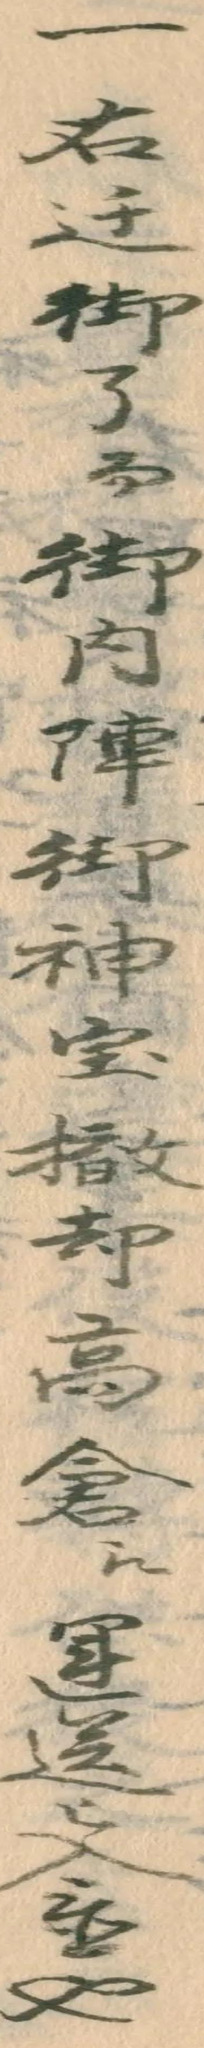一右迁御了而御内陣御神宝撤却高倉江運送被入置也
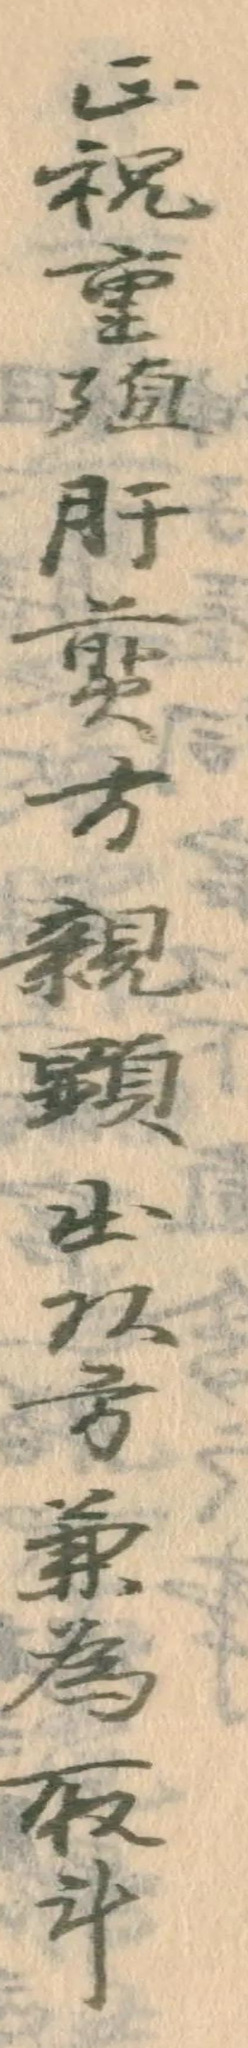正祝重殖肝煎方親顕出頭方兼為取計
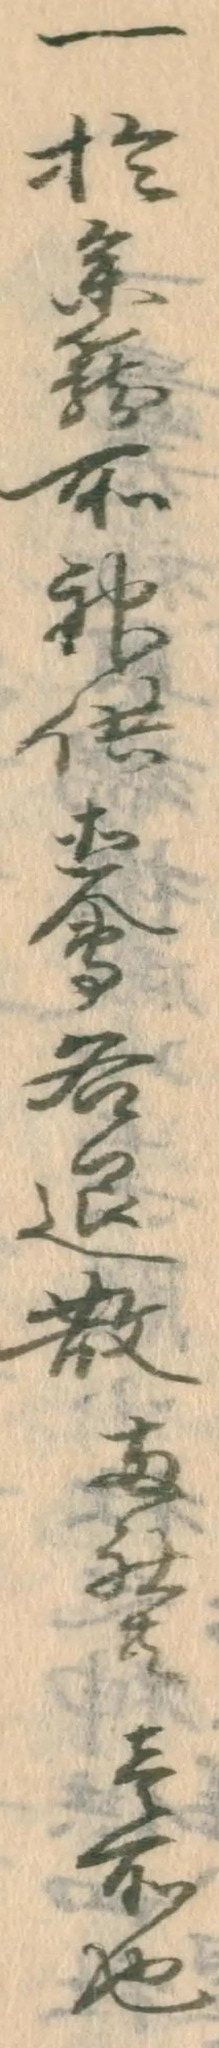一於参籠所神供直会各退散両社共壱所也
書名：賀茂社記録. 第17冊
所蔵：国立国会図書館 National Diet Library, JAPAN
